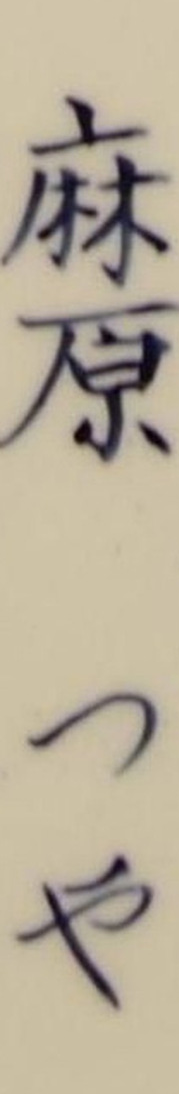麻原つや
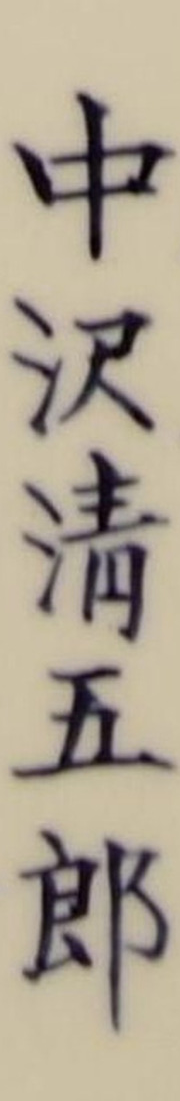中沢清五郎
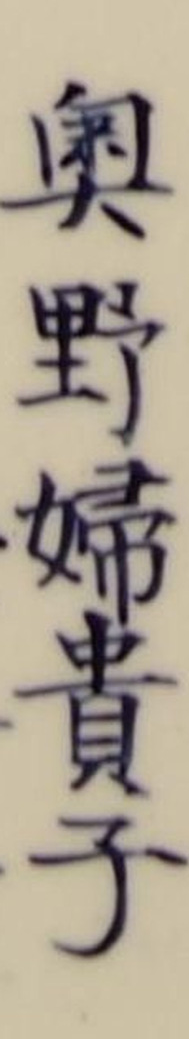奥野婦貴子
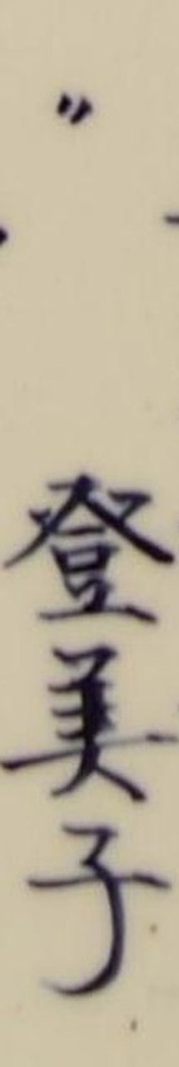登美子
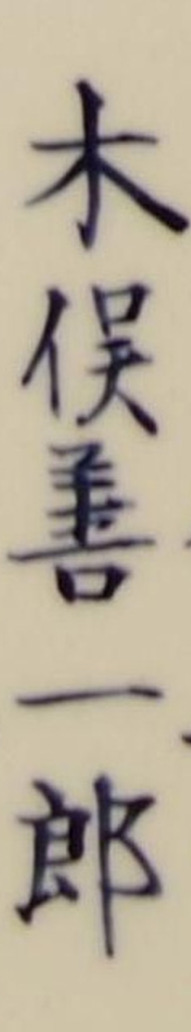木俣善一郎
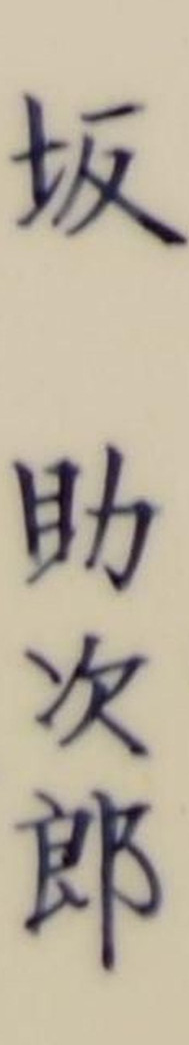坂助次郎
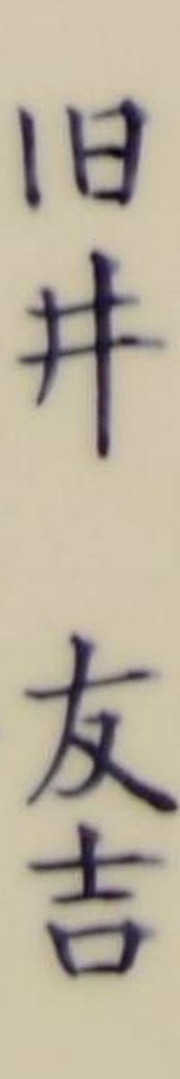旧井友吉
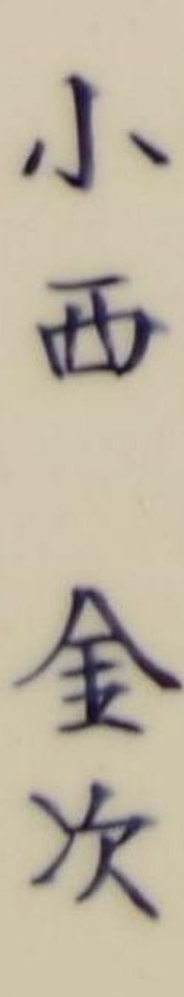小西金次
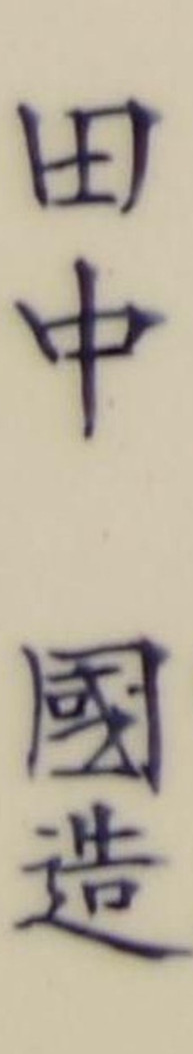田中国造
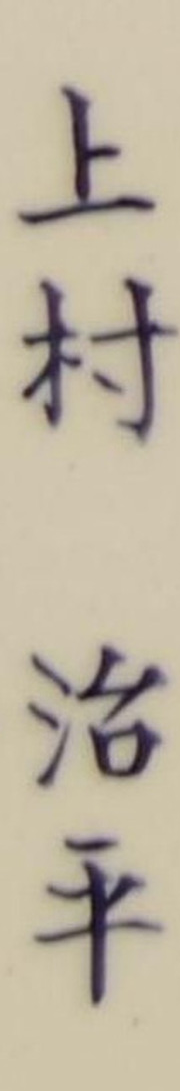上村治平
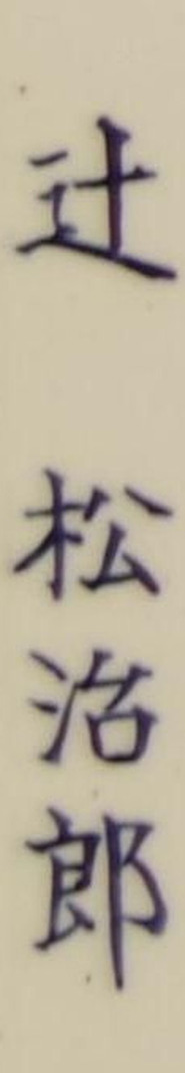辻松治郎

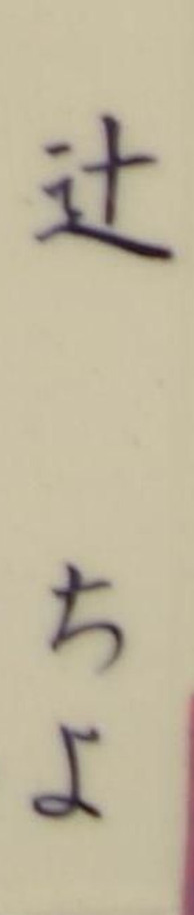辻ちよ
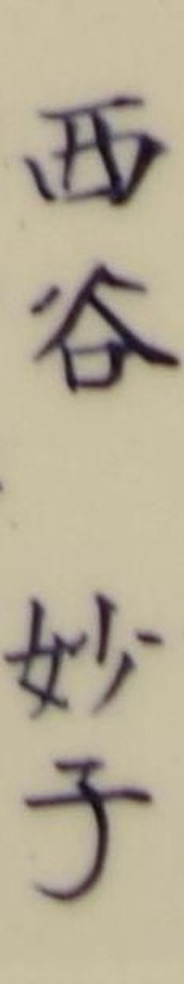西谷妙子
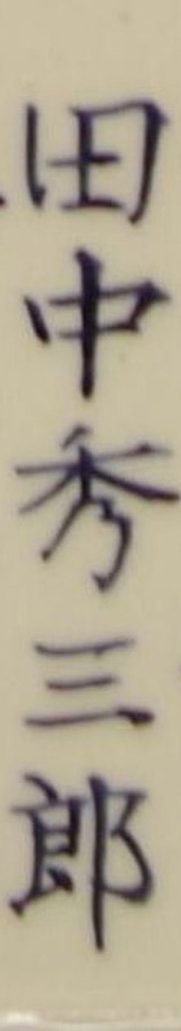田中秀三郎
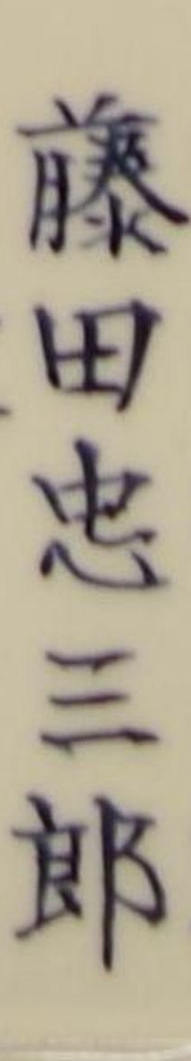藤田忠三郎
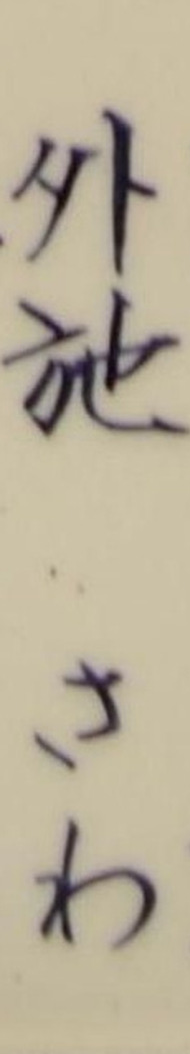外施さわ
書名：A~D
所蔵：koyasan kongobuji
